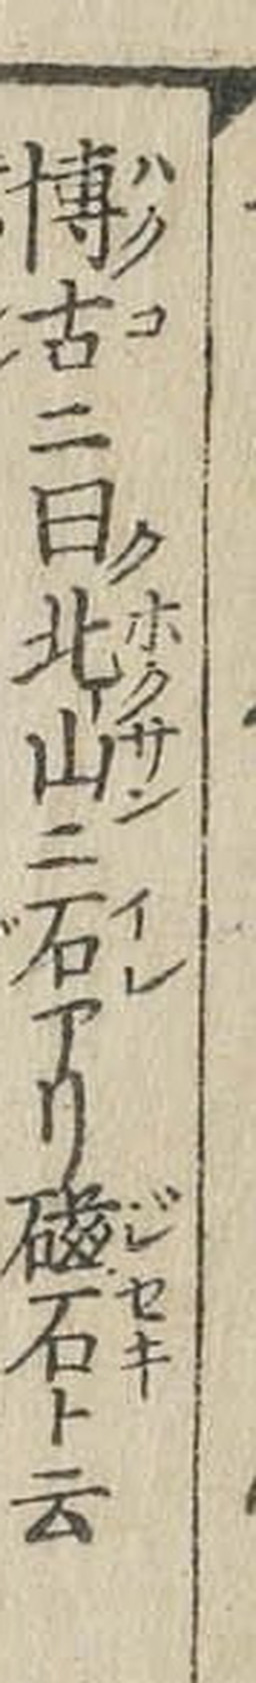博古ニ曰北-山ニ石アリ磁石ト云
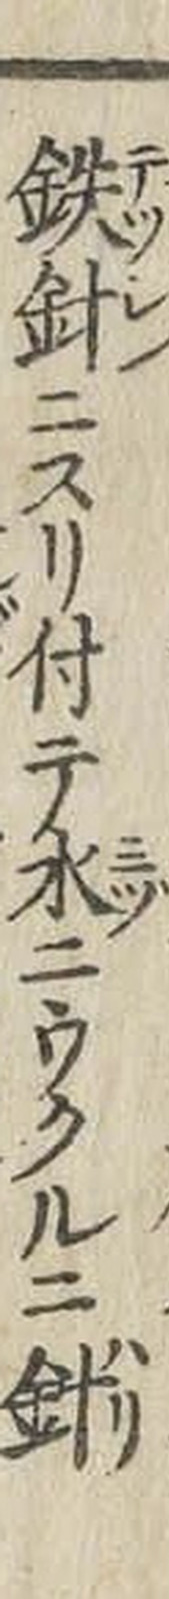鉄針ニスリ付テ水ニウクルニ針
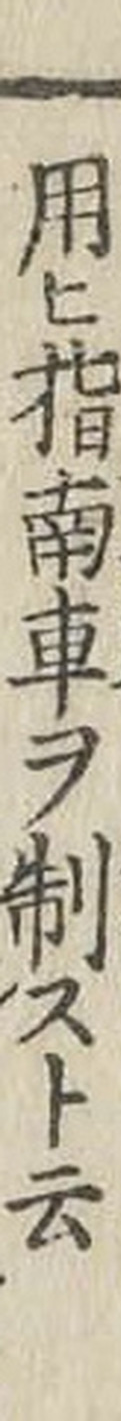用ヒ指南車ヲ制スト云
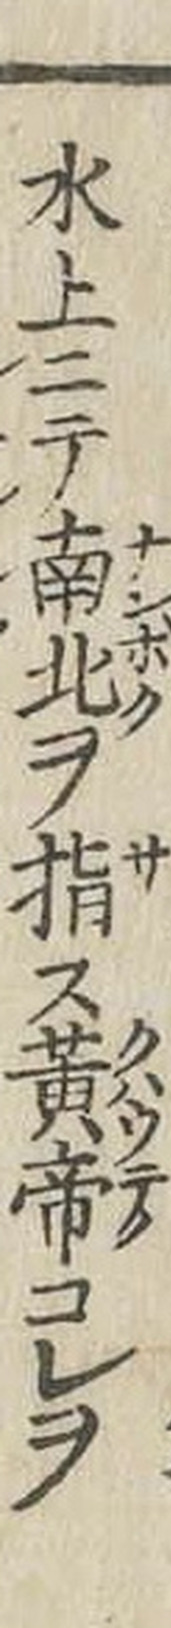水上ニテ南北ヲ指ス黄帝コレヲ
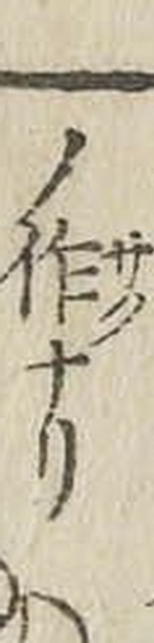ノ作ナリ
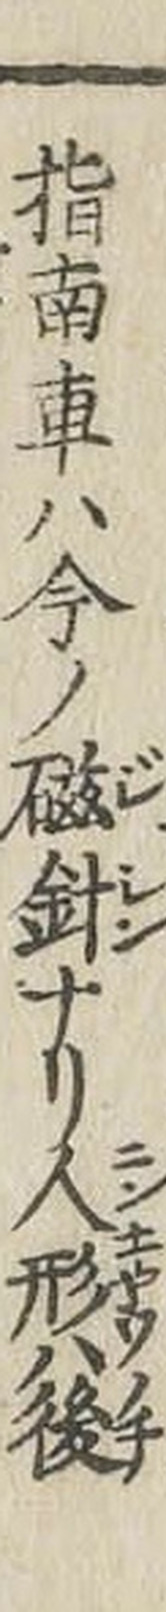指南車ハ今ノ磁針ナリ人形ハ後
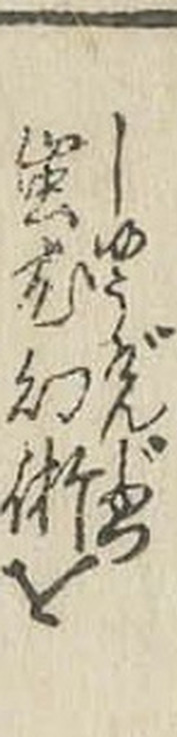蚩尤幻術を
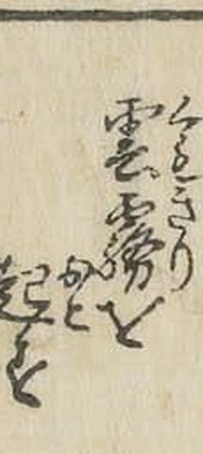雲霧を
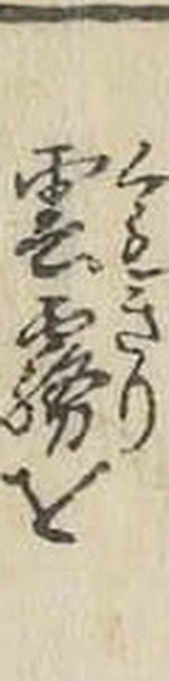雲霧を
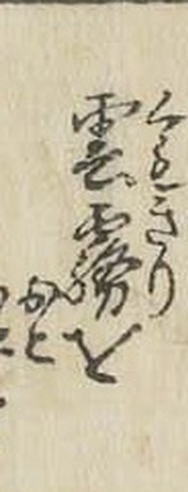雲霧を

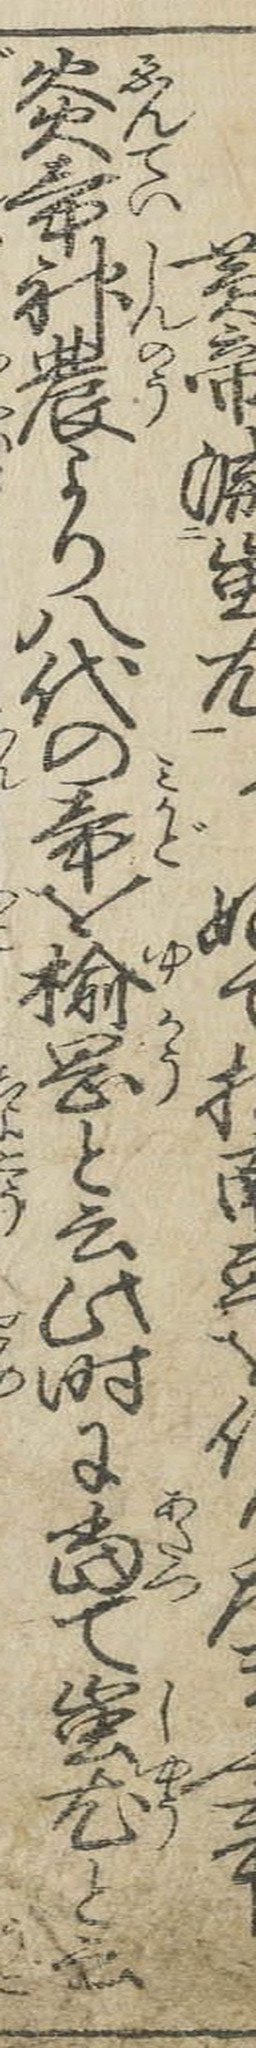炎帝神農より八代の帝を楡岡と云此時に当て蚩尤と云
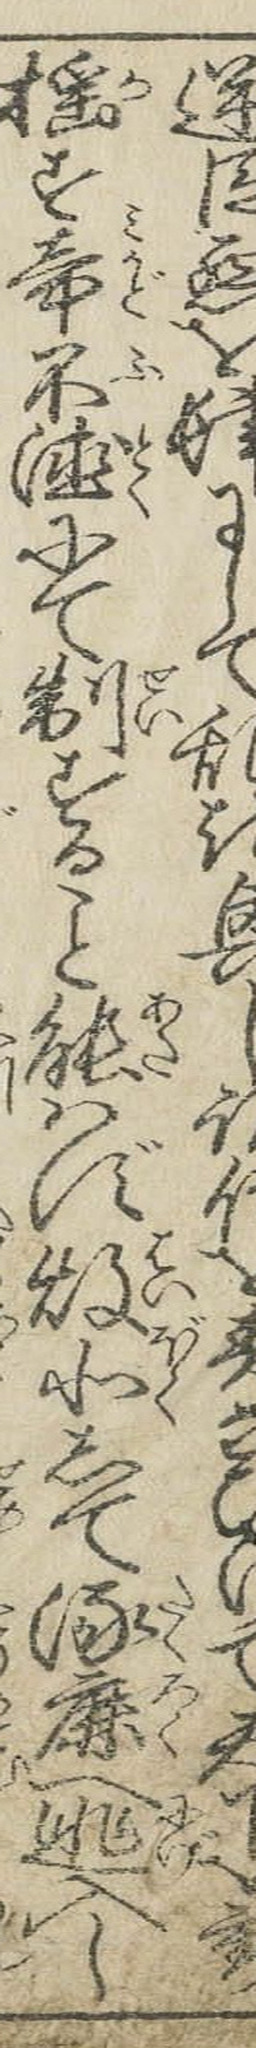揺す帝不徳にて制すること能はず敗北して涿鹿へ逃入し
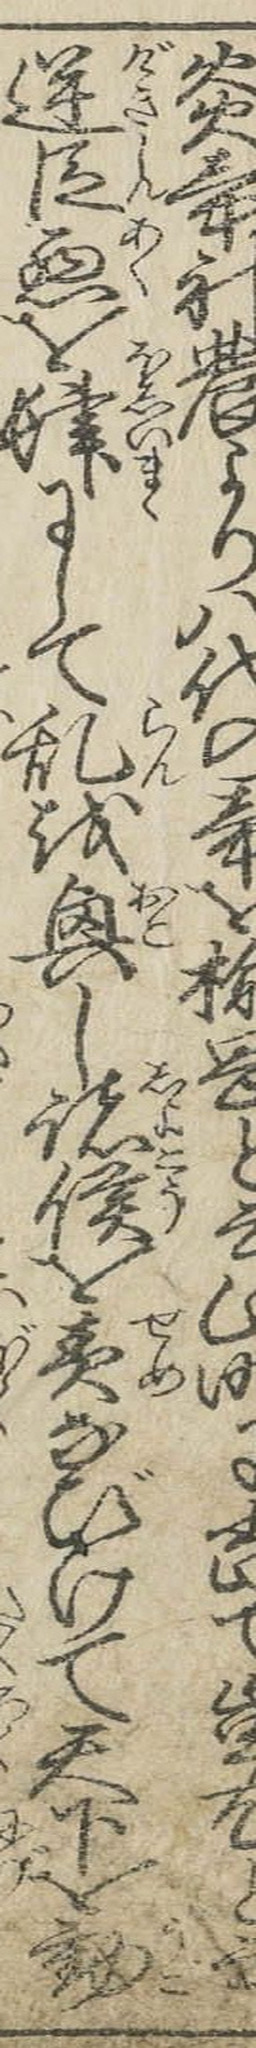逆臣悪を肆にして乱を興し諸侯を責なびけて天下を動
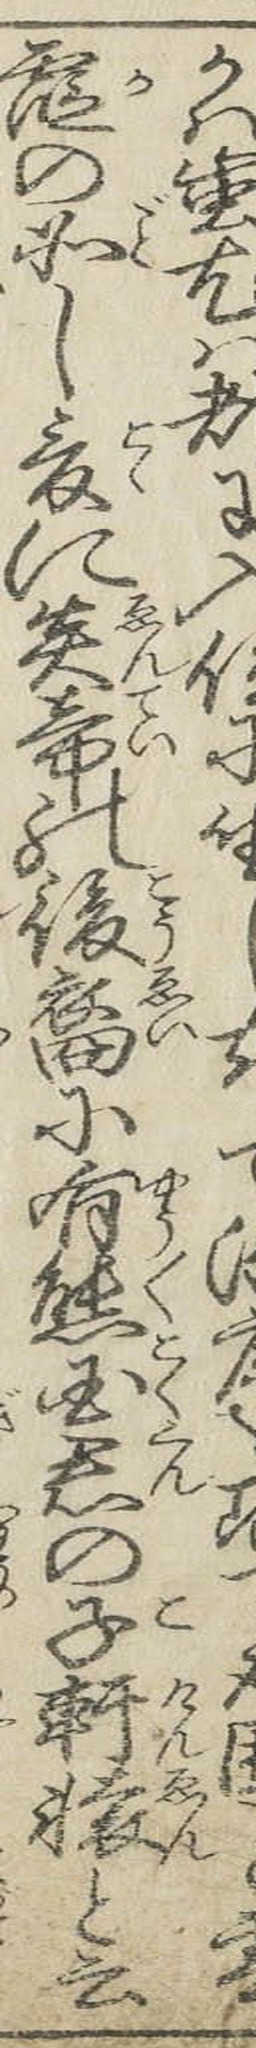霞の如し爰に炎帝の後裔に有熊国君の子軒轅と云
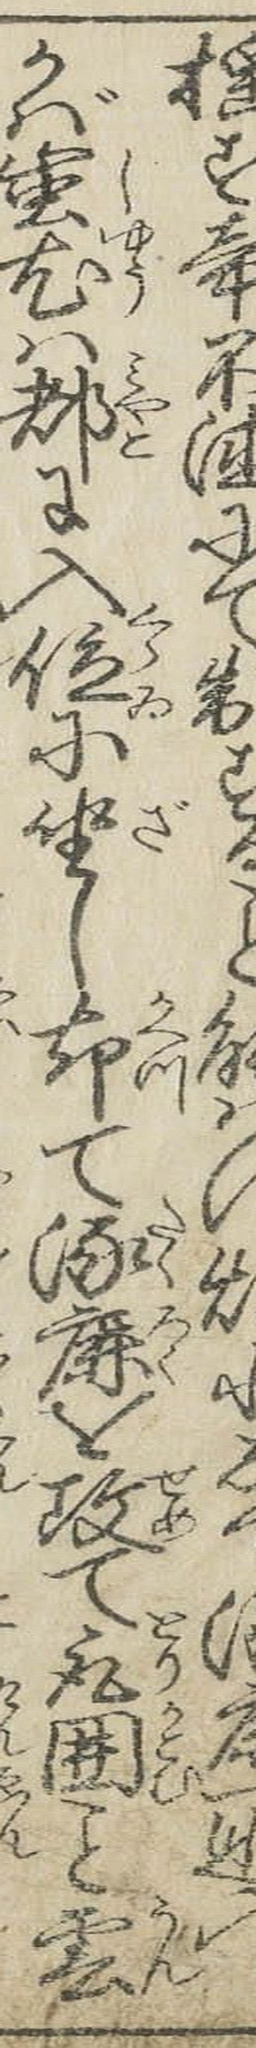かば蚩尤は都に入位に坐し却て涿鹿を攻て取囲こと雲
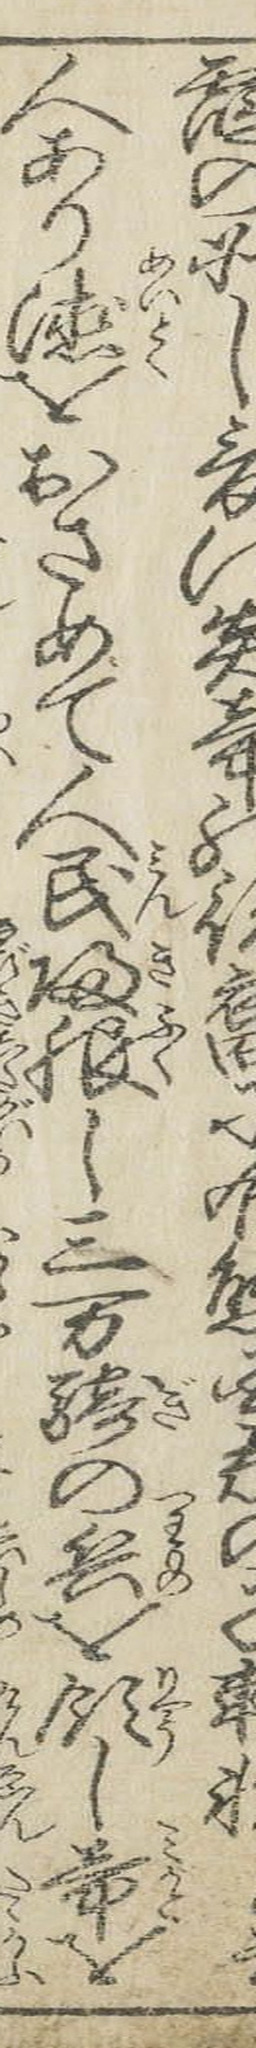人あり徳をおさめて人民帰服し三万騎の兵を領し帝を
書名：絵本写宝袋 9巻 4之巻
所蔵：東京学芸大学教育コンテンツアーカイブ
